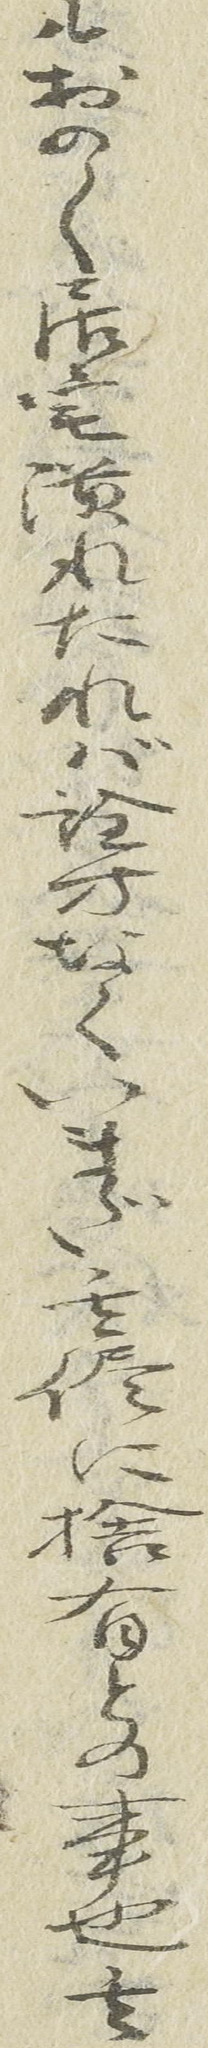もおの〳〵居宅潰れたれば詮方なくいまだ其儘に捨有との事也其
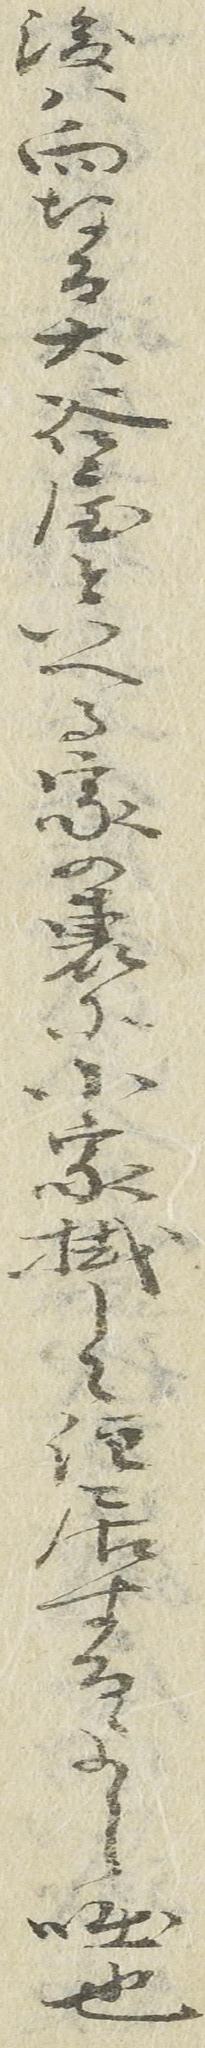後は向なる大谷屋といへる家の裏に小家掛して住居するよし咄也
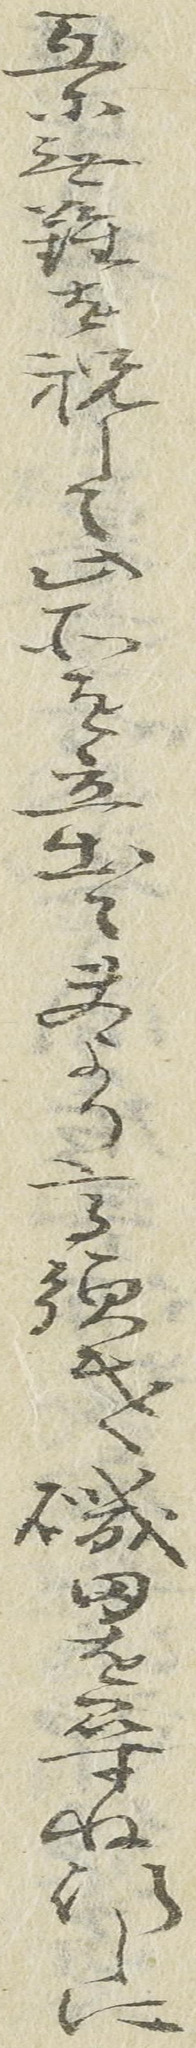互に無難を祝して此所を立出て夫より高須氏へ磯田を尋ね行しに
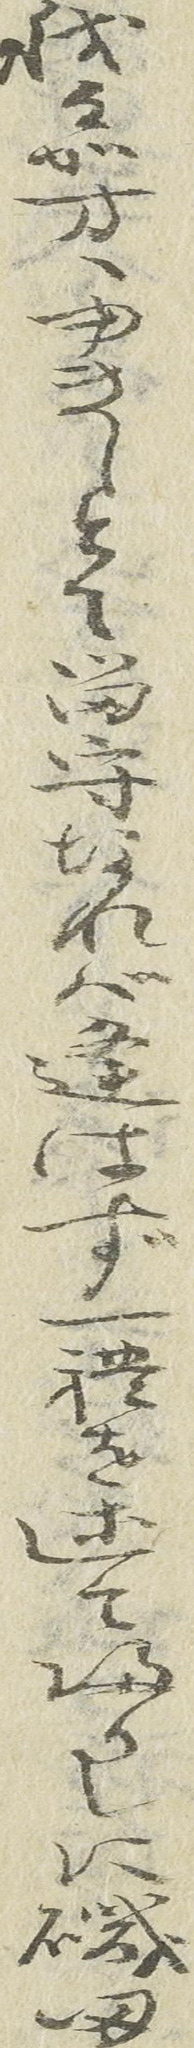我々が方へゆきしとて留守なれば逢はず一禮を述て帰りしに磯田
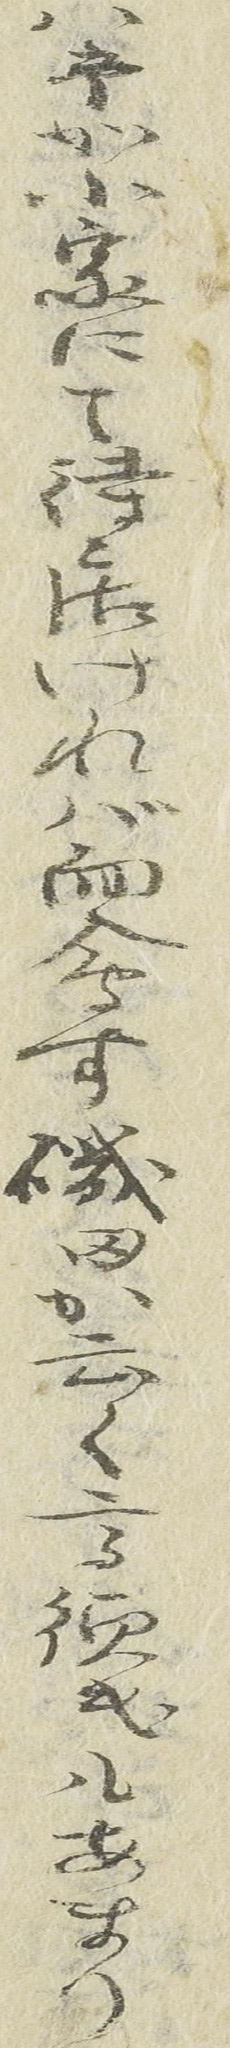は予が小家にて待ち居ければ面会す磯田か云く高須氏もあまり

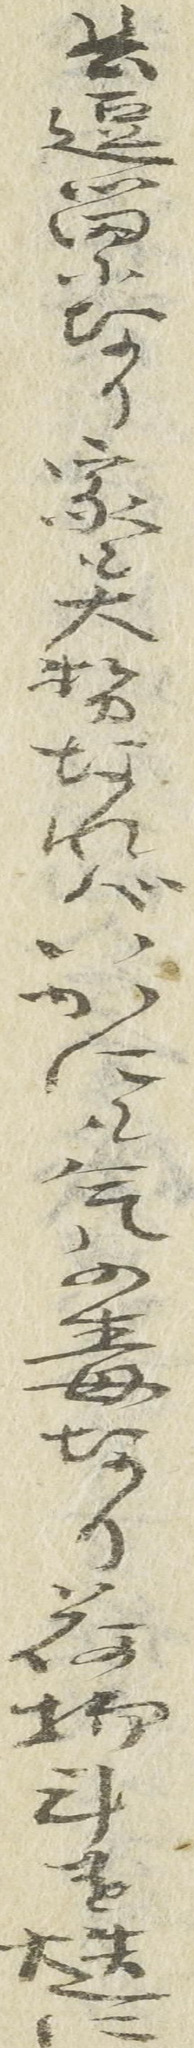長逗留になり家も大勢なればいかにも気の毒なり荷物斗を慥に
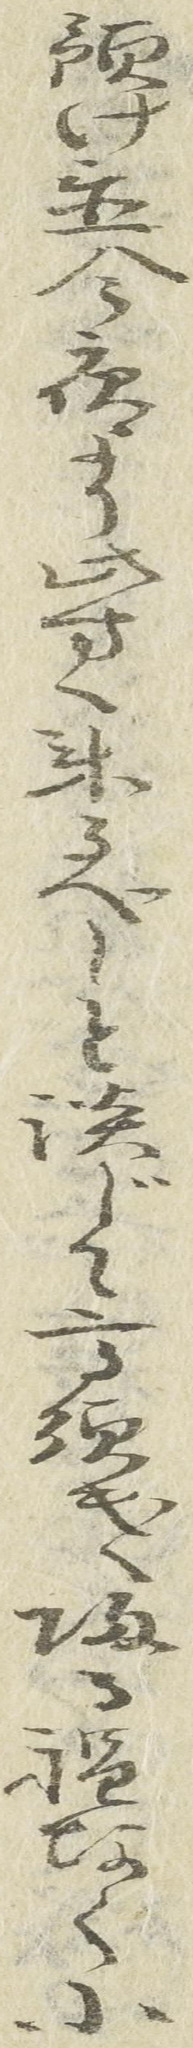預け置今夜より此方へ来るべしと談じて高須氏へ帰る程なく小
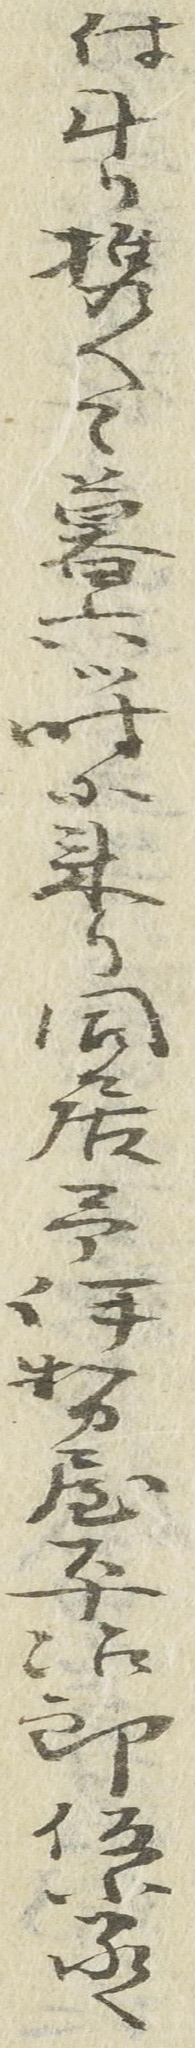付斗り携へて暮六ツ時に来り同居予伊勢屋平治郎仮小家へ
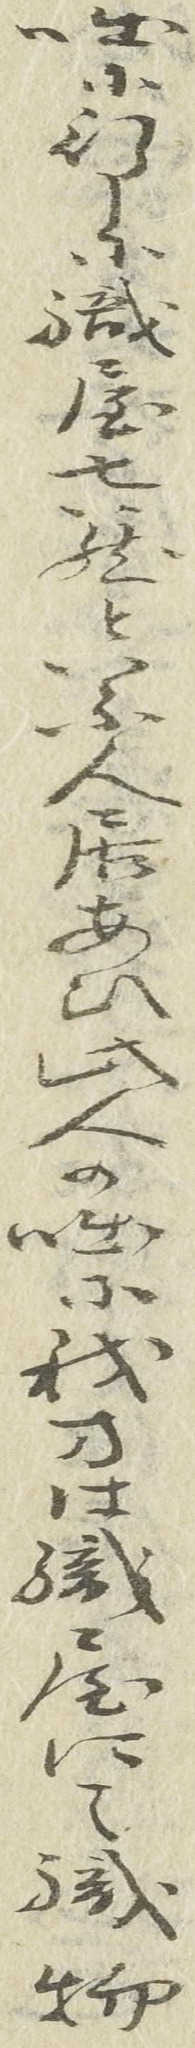咄に行しに織屋七蔵という人居あひ此人の咄に我方は織屋にて織物
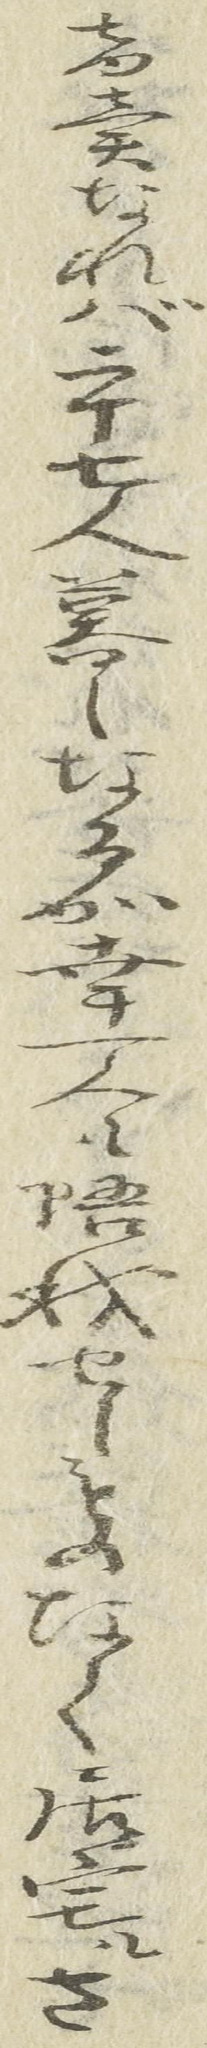商売なれば二十七人暮しなるが幸一人も怪？我せしものなく居宅もさ
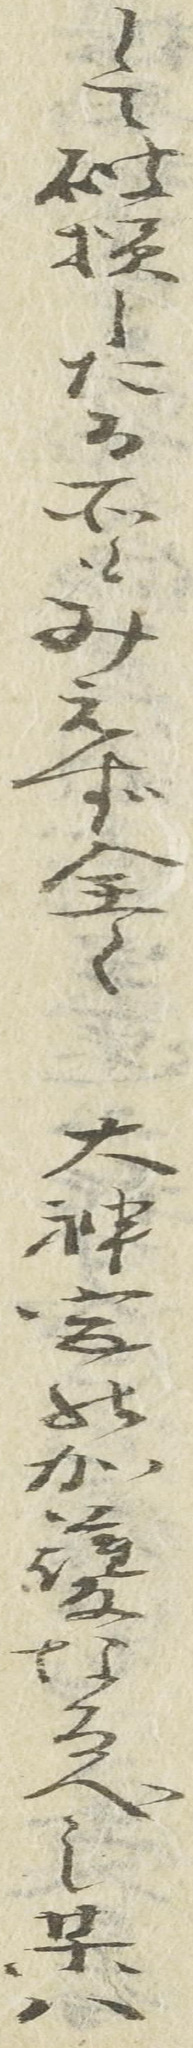して破損したる所もみえず全く大神宮の加護なるべし某は
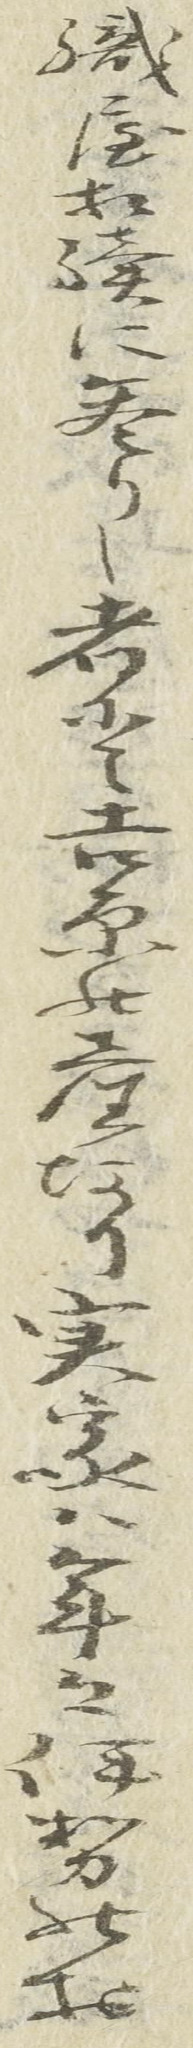織屋相談に参りし者にて吉原の産なり実家は年々伊勢のお
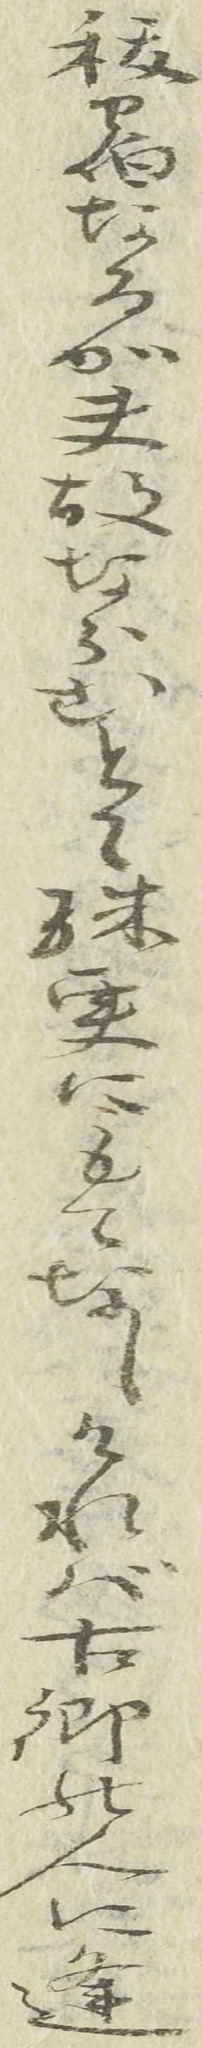祓宿なるが夫故ならむとて殊更にもてなしければ古郷の人に逢
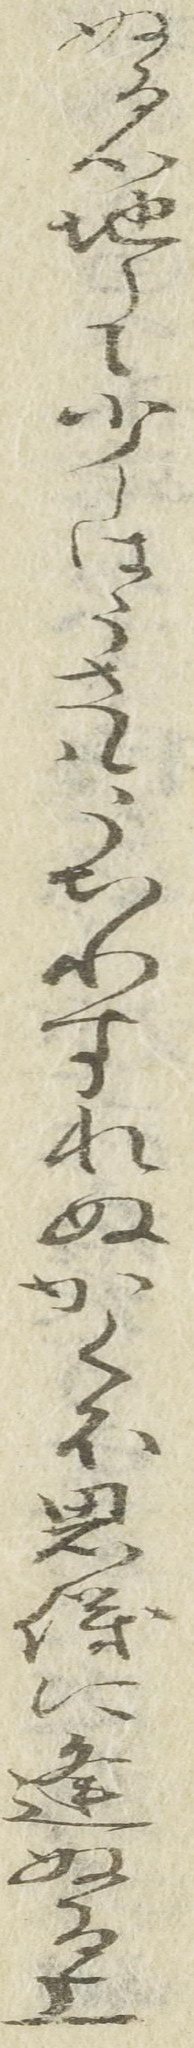ぬる心地して少しはうさもうちわすれぬかく不思儀に逢ぬる上
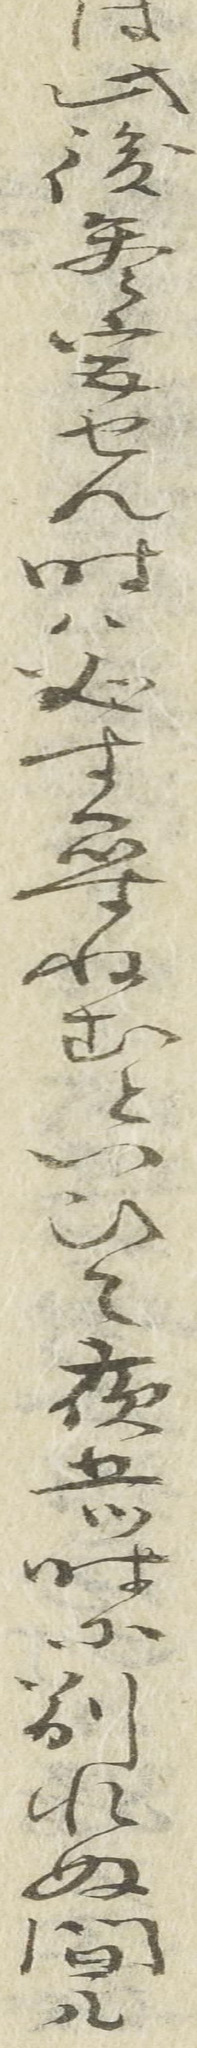は此後参宮せん時は必す尋ねむといひて夜五ツ時に別れぬ間も
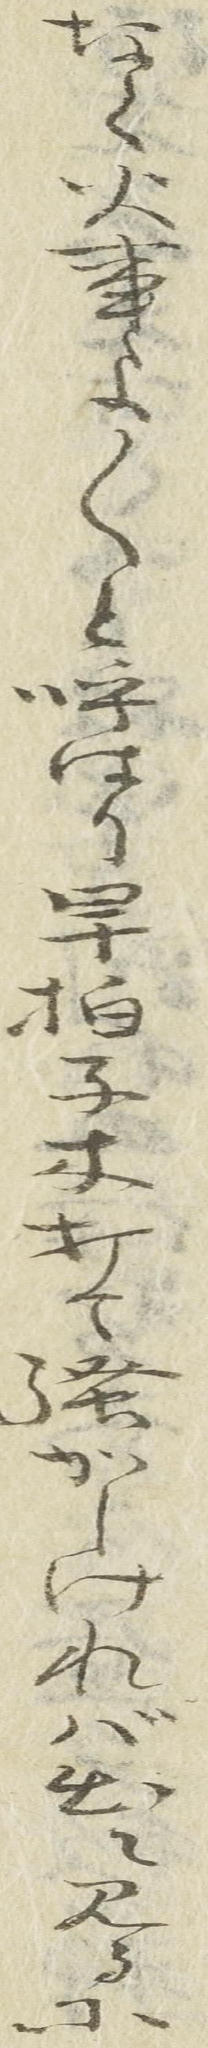なく火事よ〳〵と呼はり早拍子木打て騒かしければ出て見るに
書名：地震前兆集　全
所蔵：東京大学地震研究所図書室 Earthquake Research Institute Library, The University of Tokyo, JAPAN
